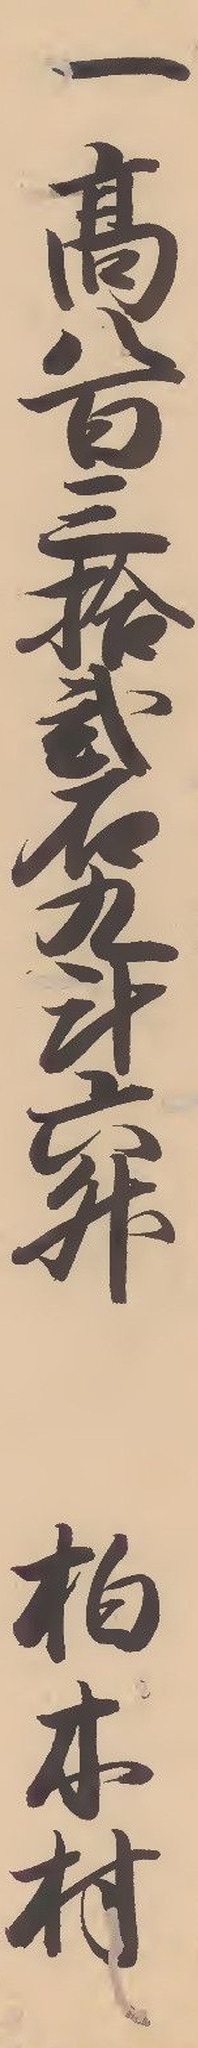一高八百三拾弐石九斗六升柏木村
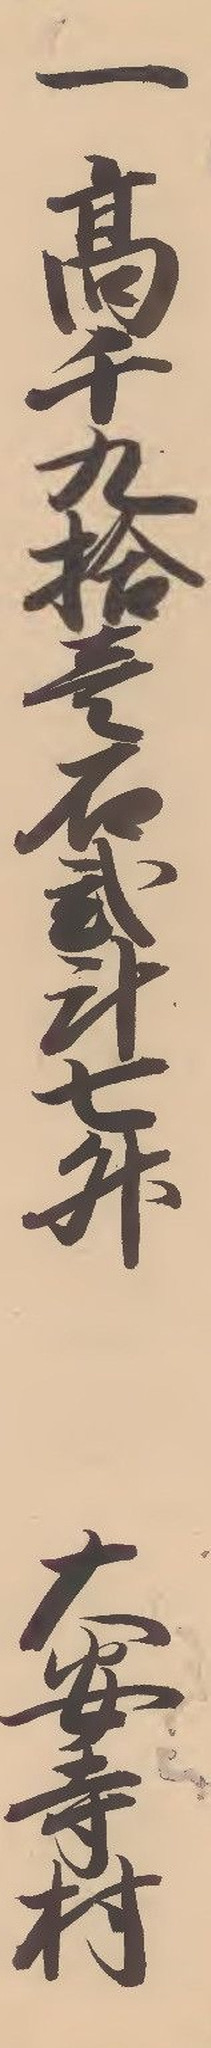一高千九拾壱石弐斗七升大安寺村
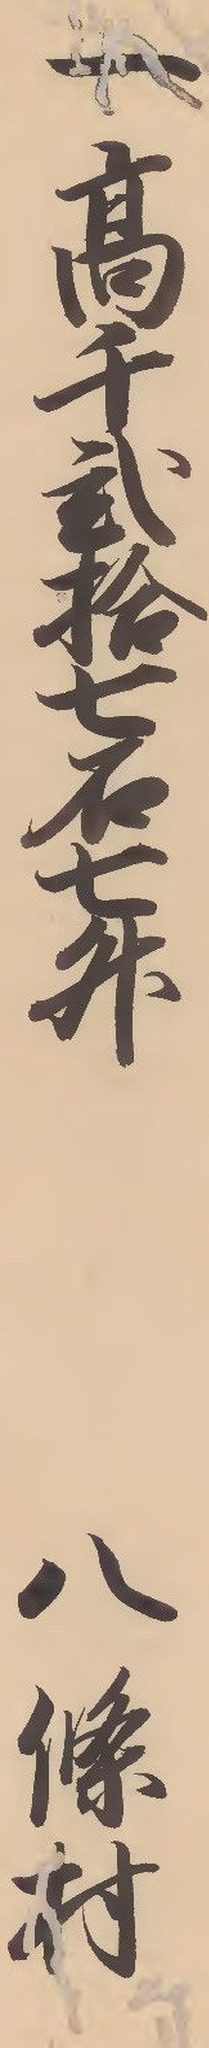一高千弐拾七石七升八条村
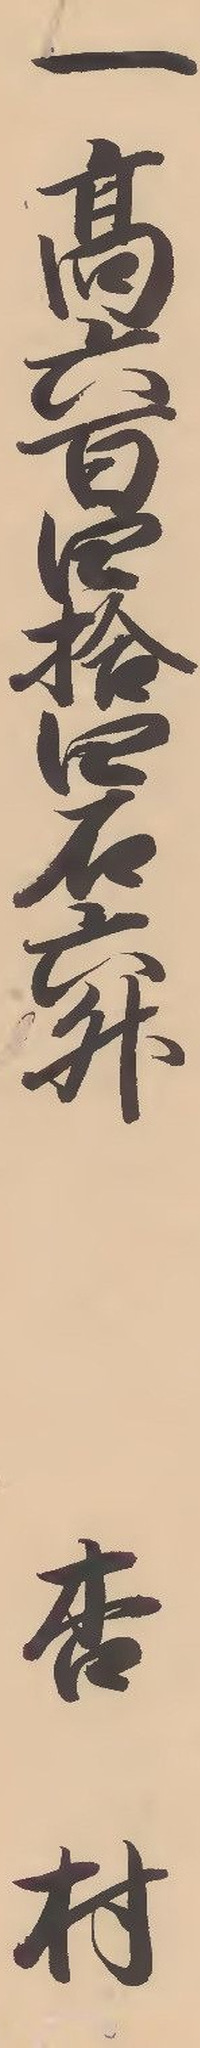一高六百四拾四石六升杏村
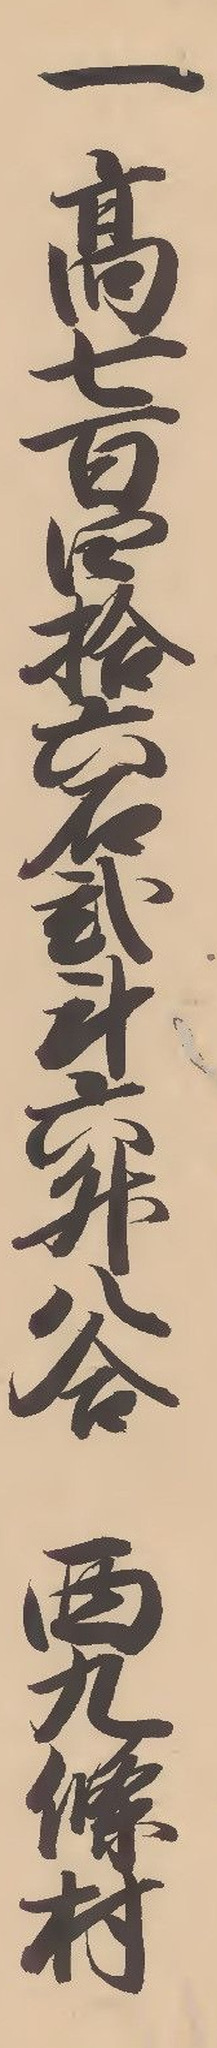一高七百四拾六石弐斗六升八合西九条村
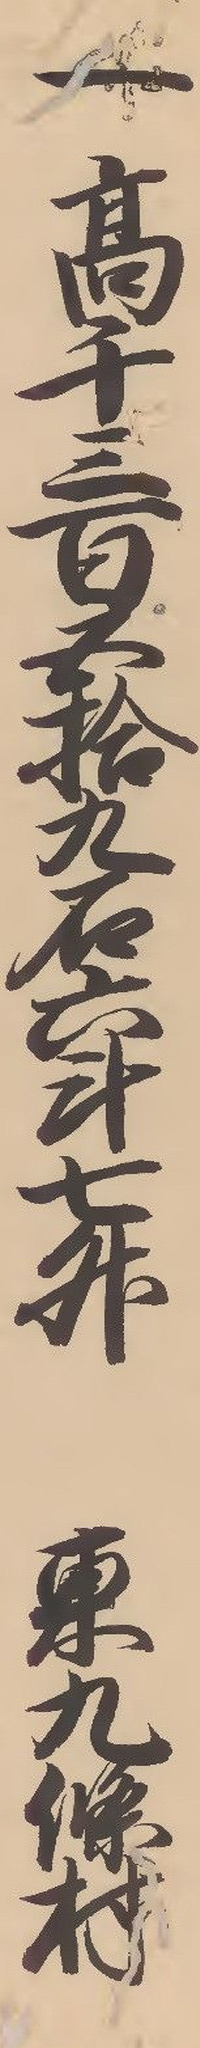一高千三百五拾九石六斗七升東九条村
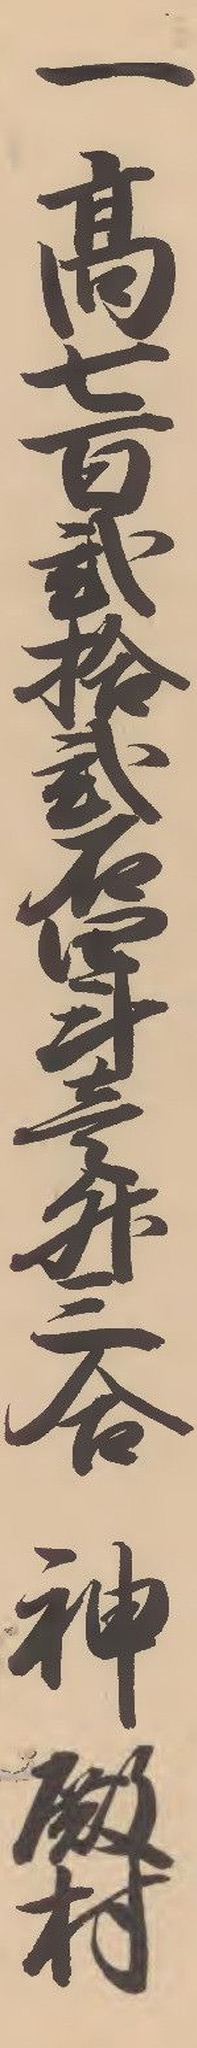一高七百弐拾弐石四斗壱升三合神殿村
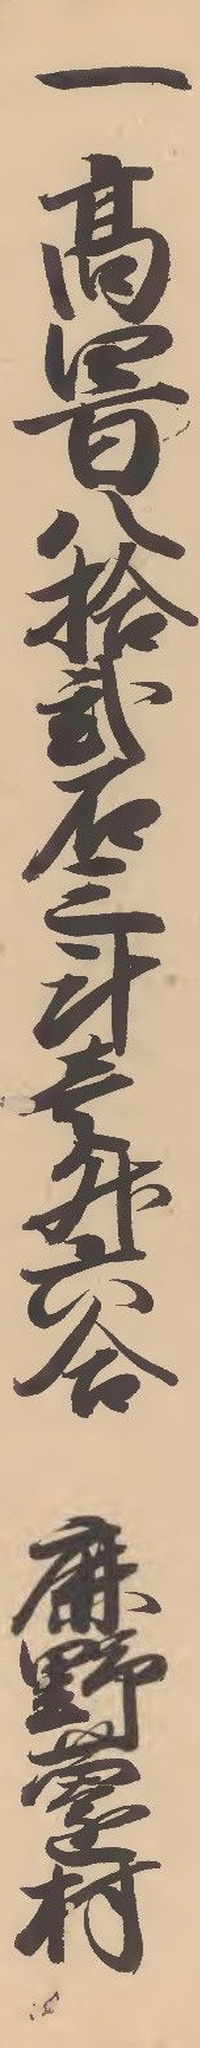一高四百八拾弐石三斗壱升六合鹿野薗村

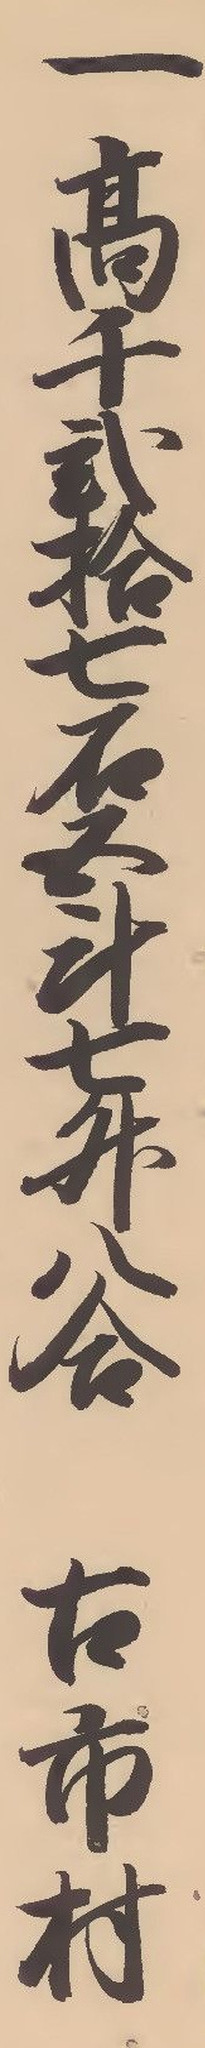一高千弐拾七石五斗七升八合古市村
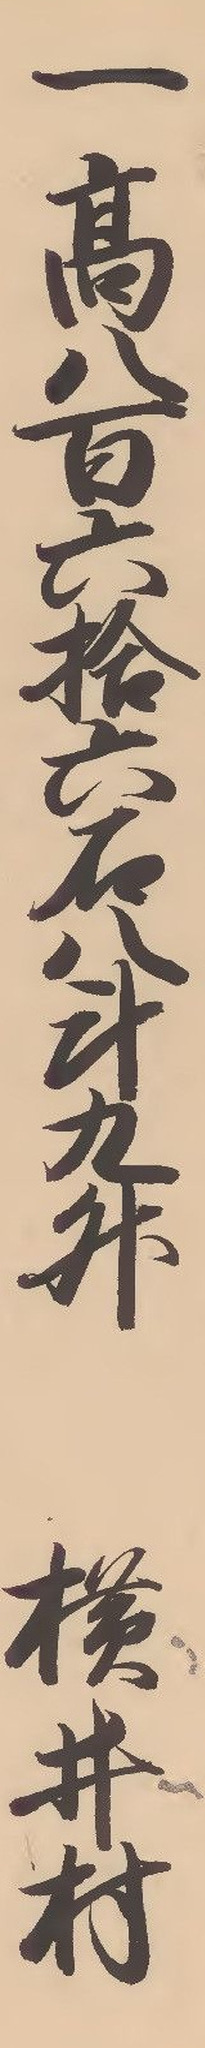一高八百六拾六石八斗九升横井村
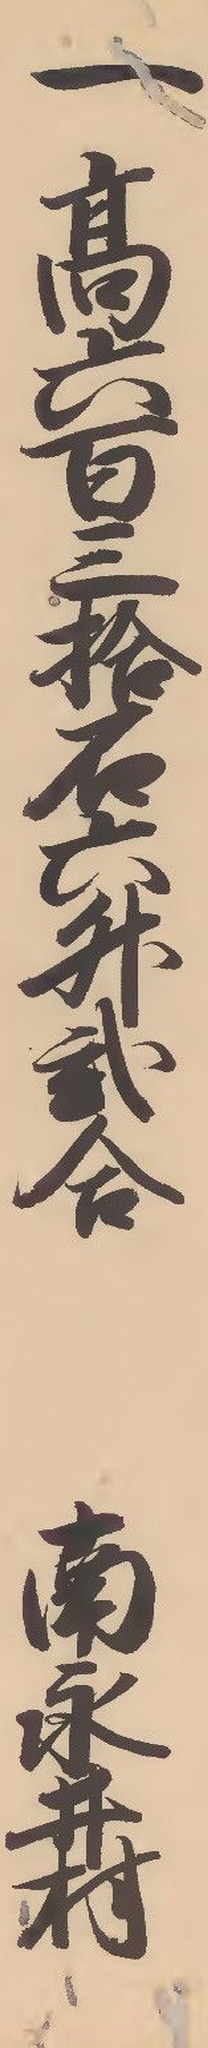一高六百三拾石六升弐合南永井村
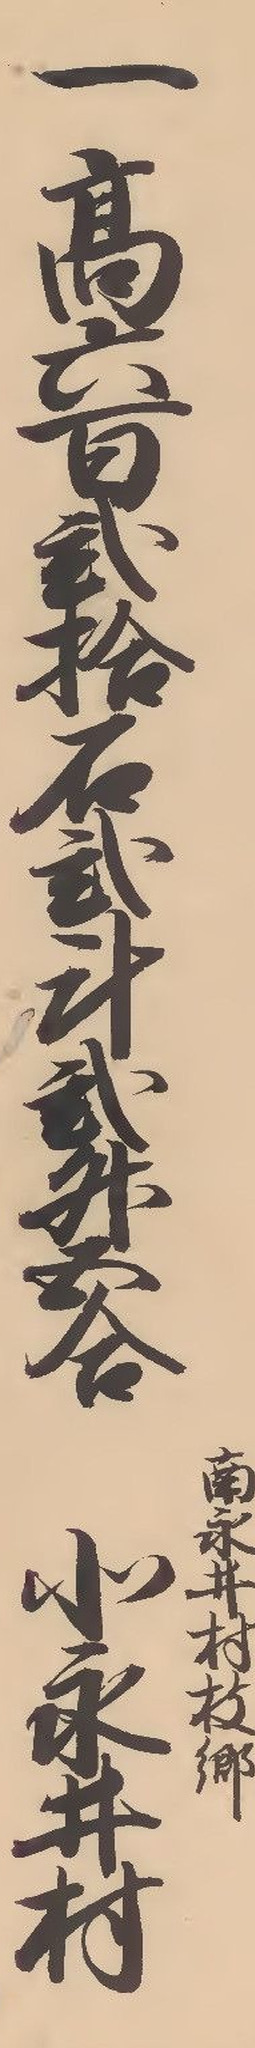一高六百弐拾石弐斗弐升五合北永井村
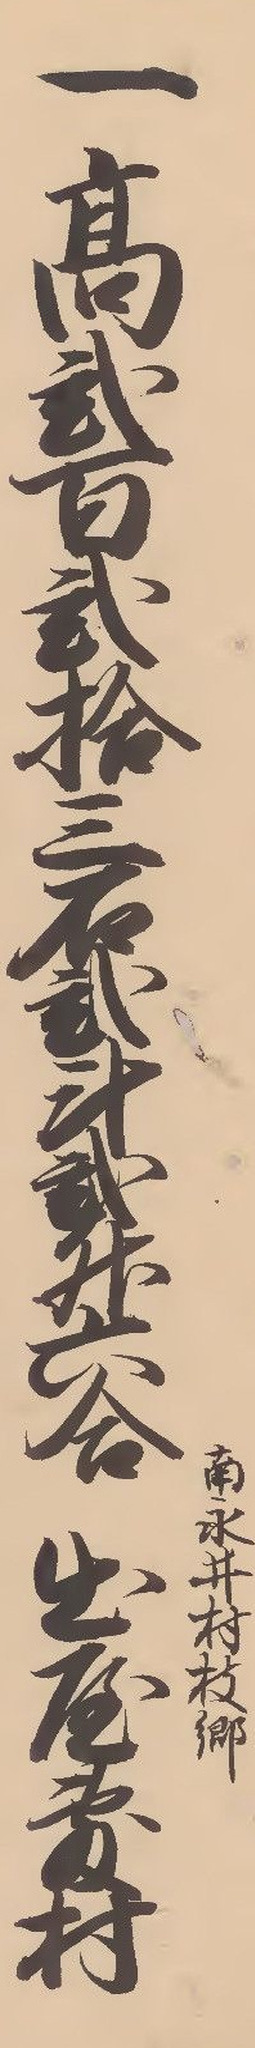一高弐百弐拾三石弐斗弐升六合出屋敷村
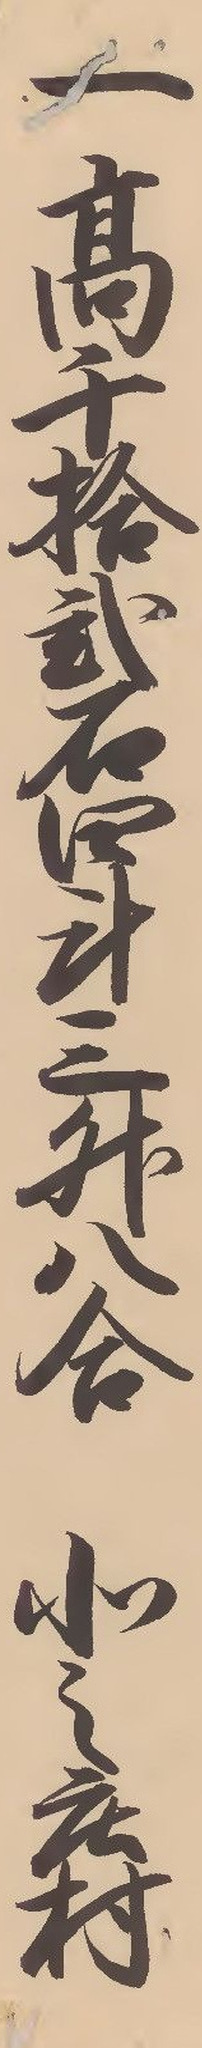一高千拾弐石四斗三升八合北之庄村
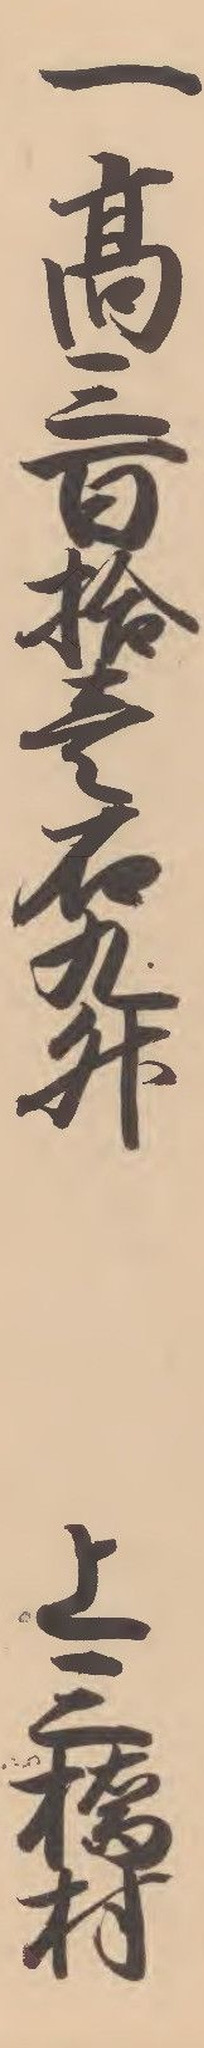一高三百拾壱石九升上三橋村
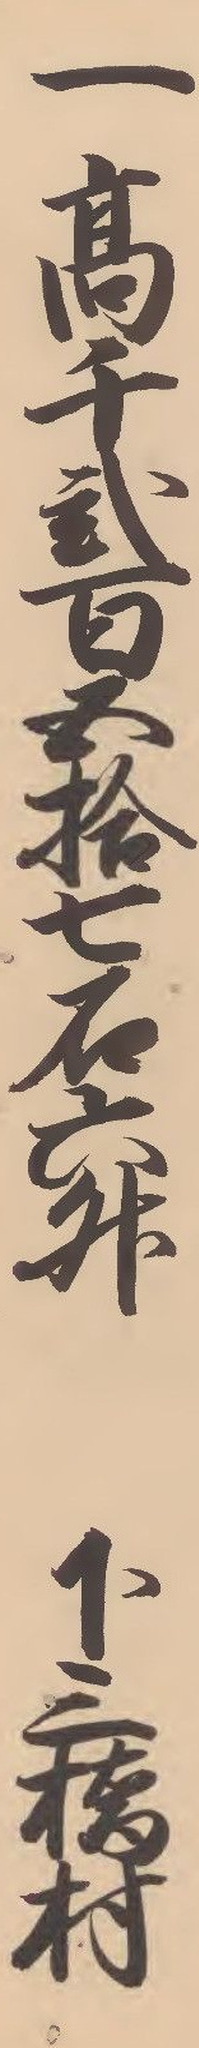一高千弐百五拾七石六升下三橋村
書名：大和国郷帳
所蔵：国立公文書館 National Archives of Japan
